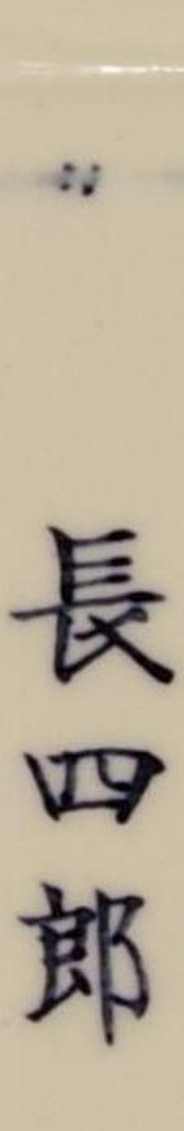長四郎
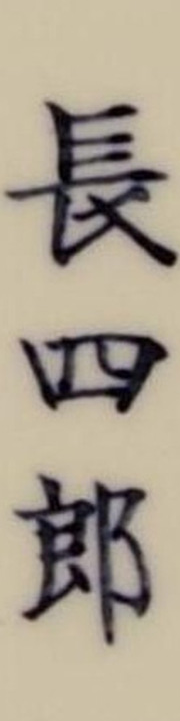長四郎
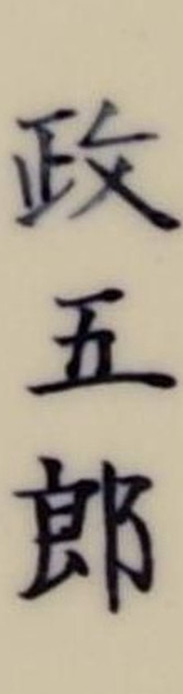政五郎
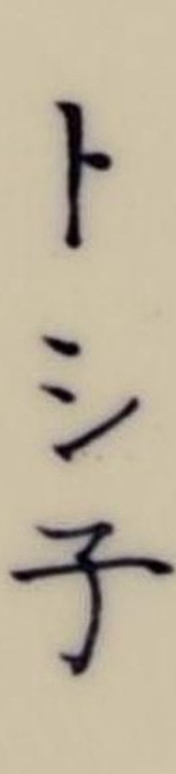トシ子
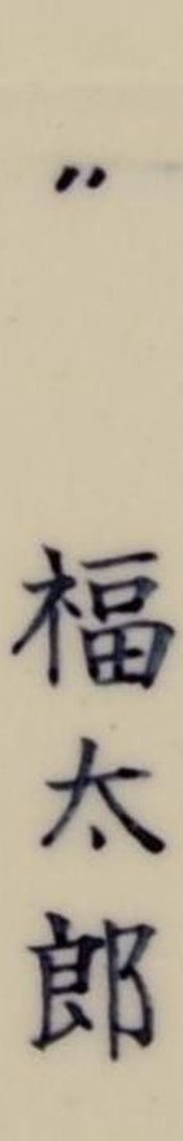福太郎
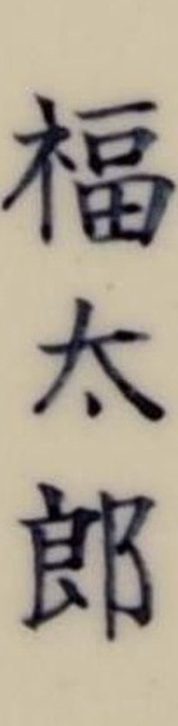福太郎
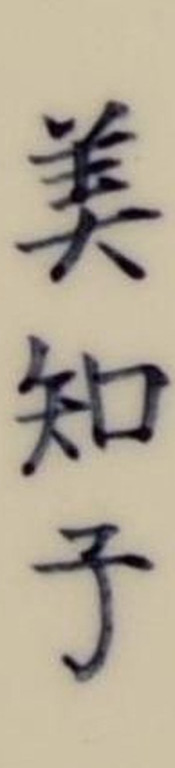美知子
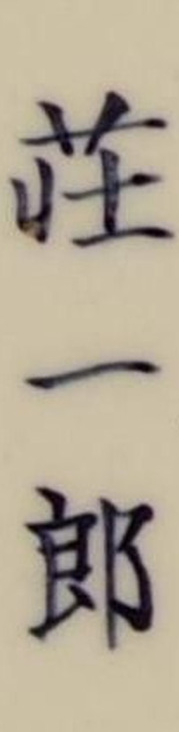荘一郎
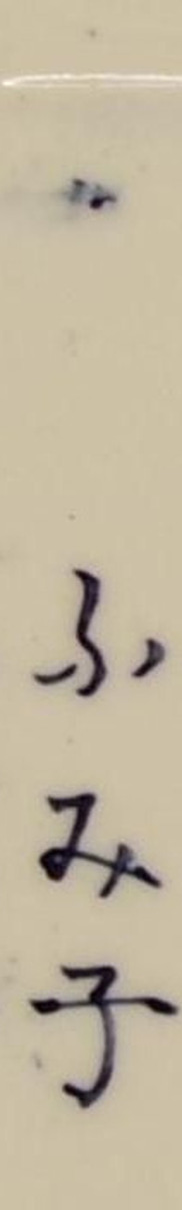ふみ子
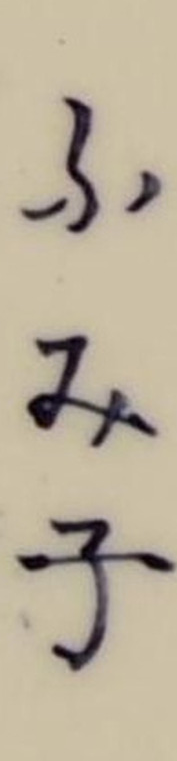ふみ子
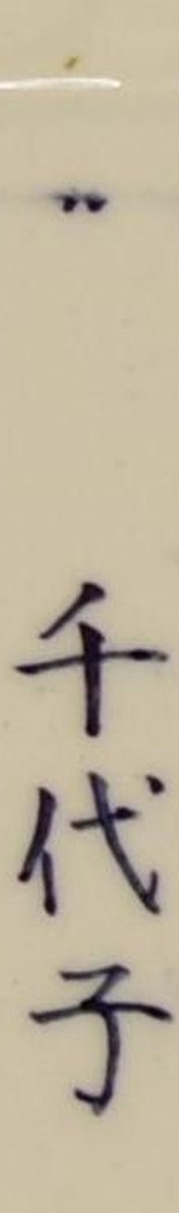千代子
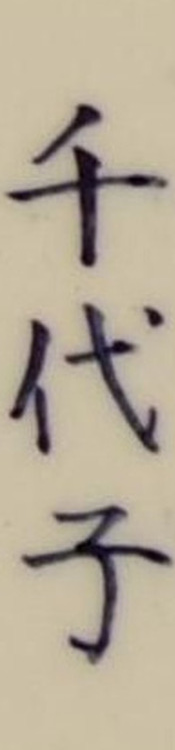千代子
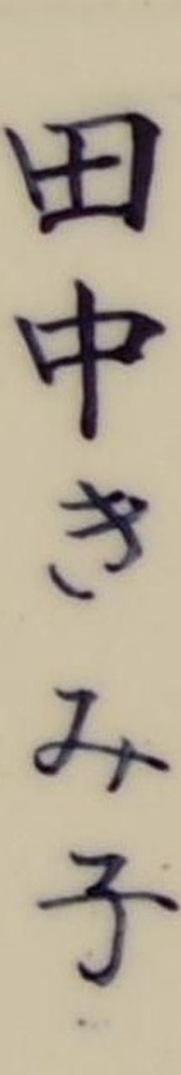田中きみ子
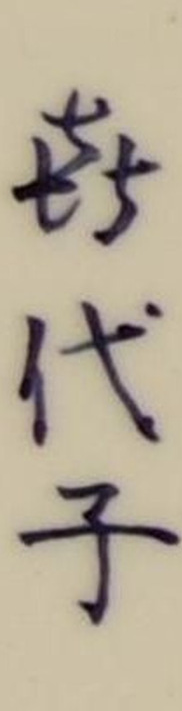喜代子
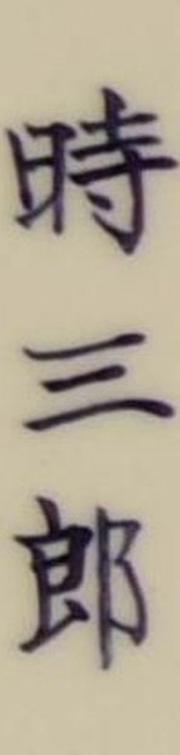時三郎
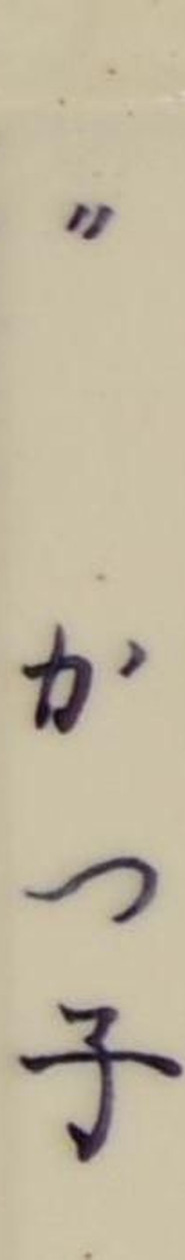かつ子
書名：A~D
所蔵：koyasan kongobuji
